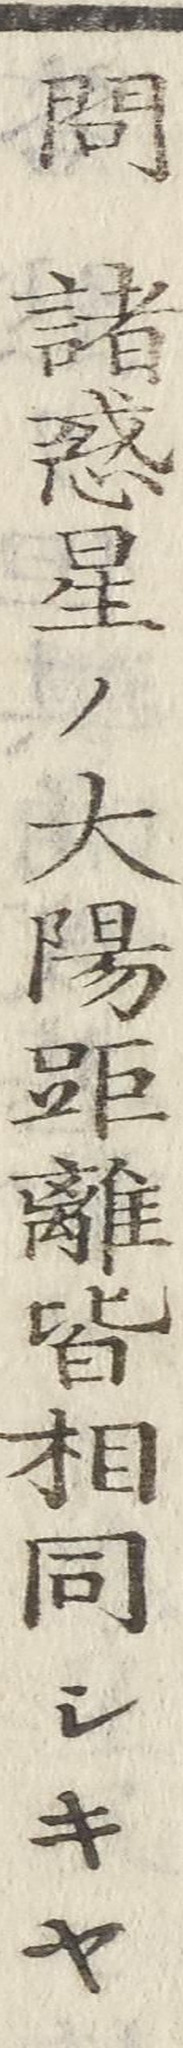問諸惑星ノ太陽距離皆相同シキヤ
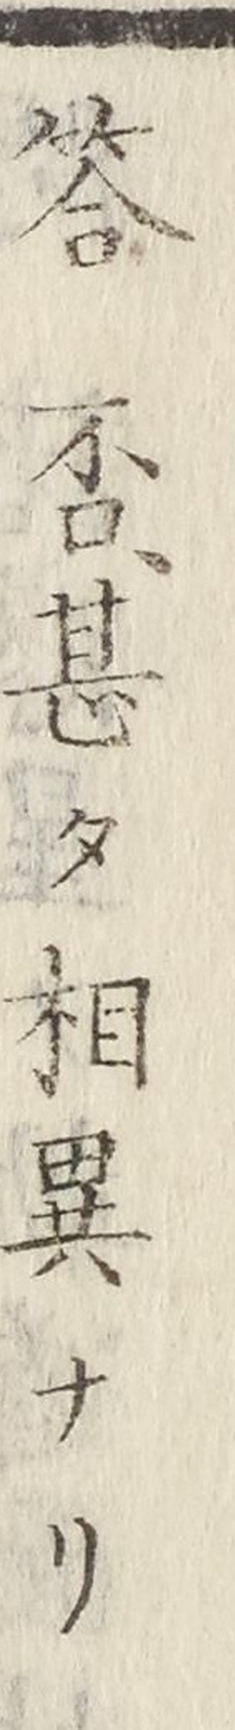答否、甚タ相異ナリ
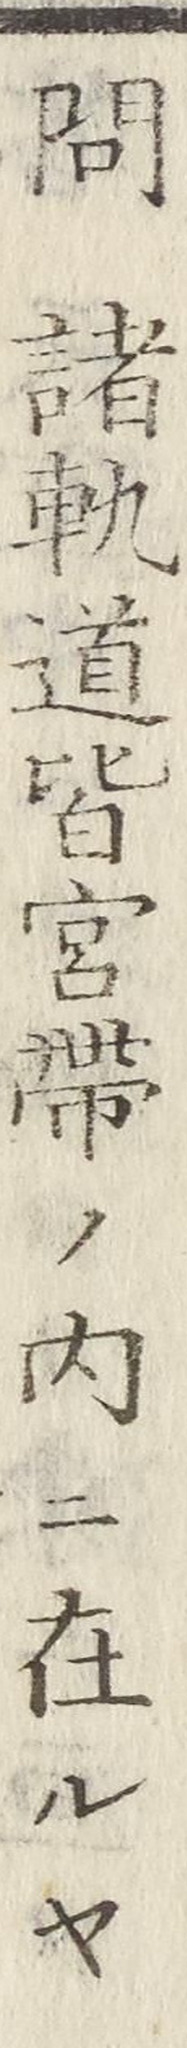問諸軌道皆宮帯ノ内ニ在ルヤ
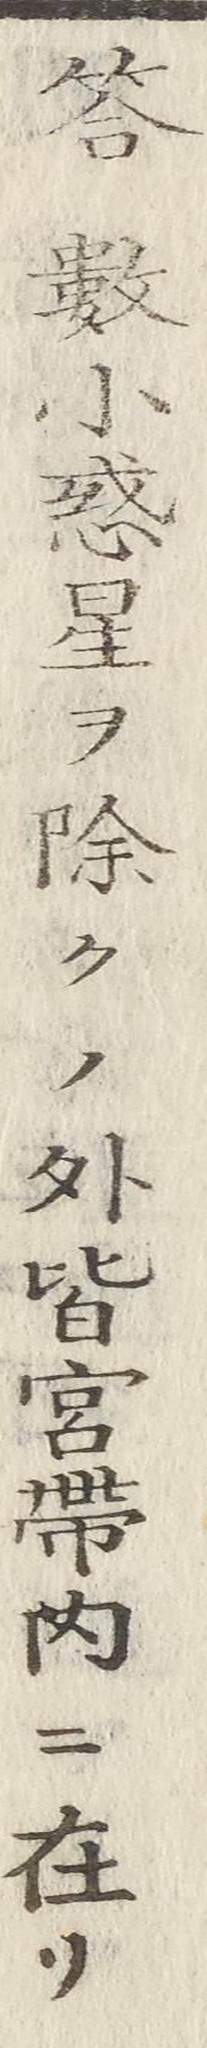答数小惑星ヲ除クノ外皆宮帯内ニ在リ
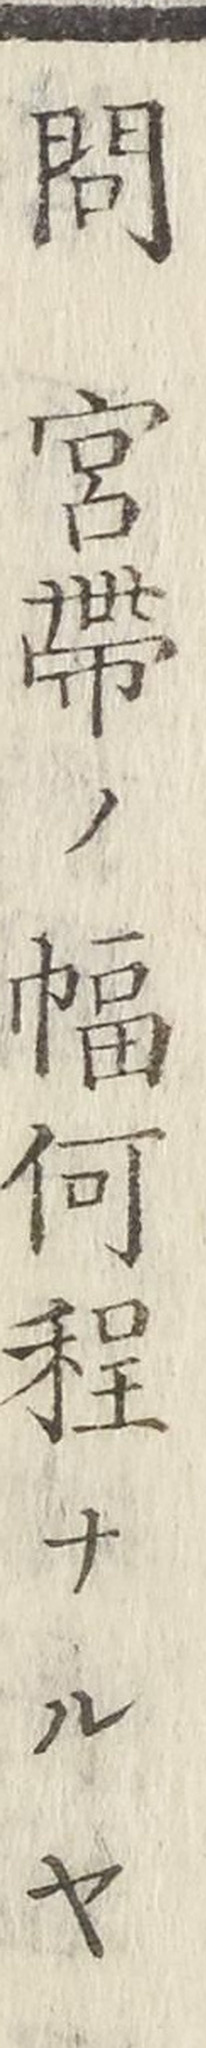問宮帯ノ幅何程ナルヤ
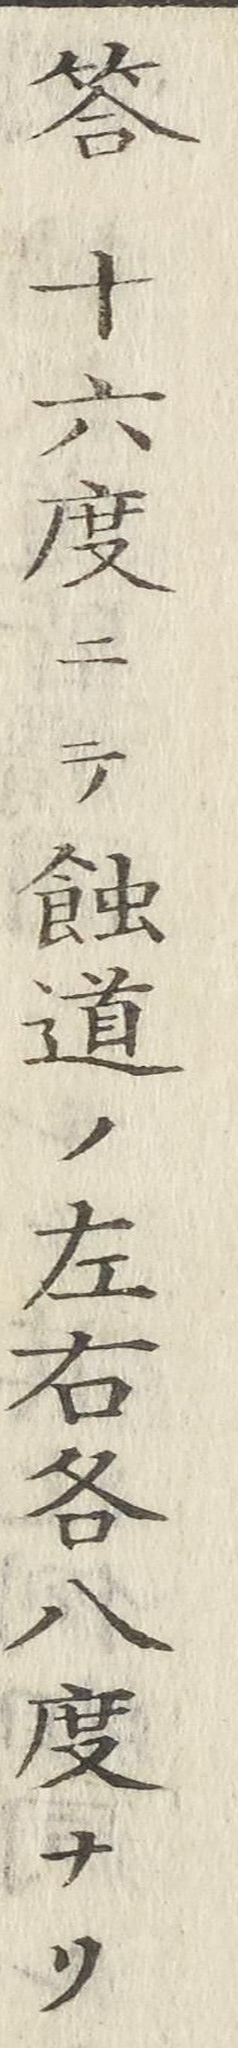答十六度ニテ蝕道ノ左右各八度ナリ
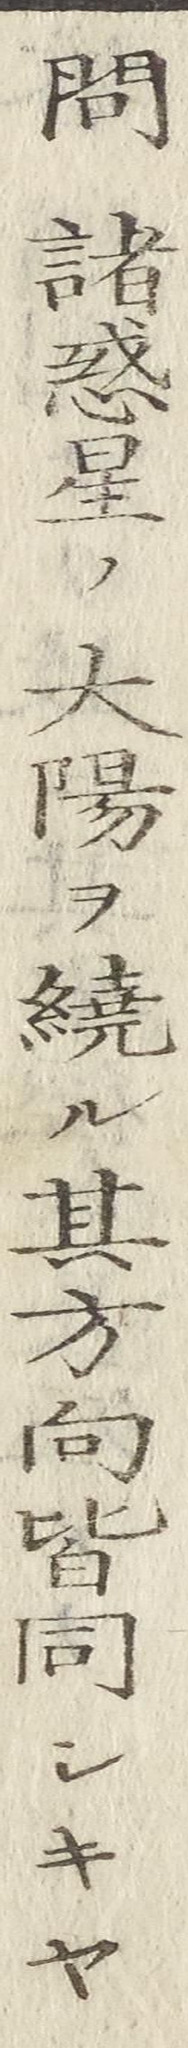問諸惑星ノ大陽ヲ繞ル其方向皆同シキヤ
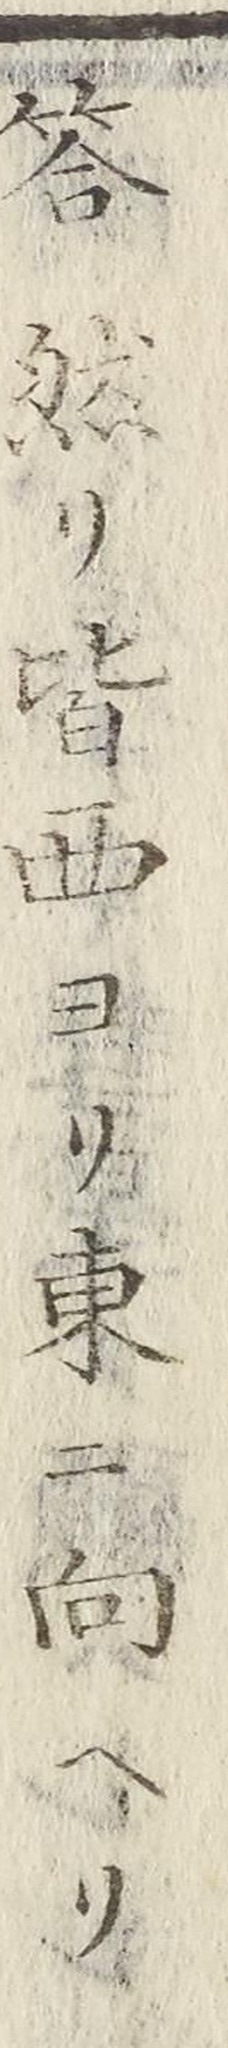答然リ皆西ヨリ東ニ向ヘリ
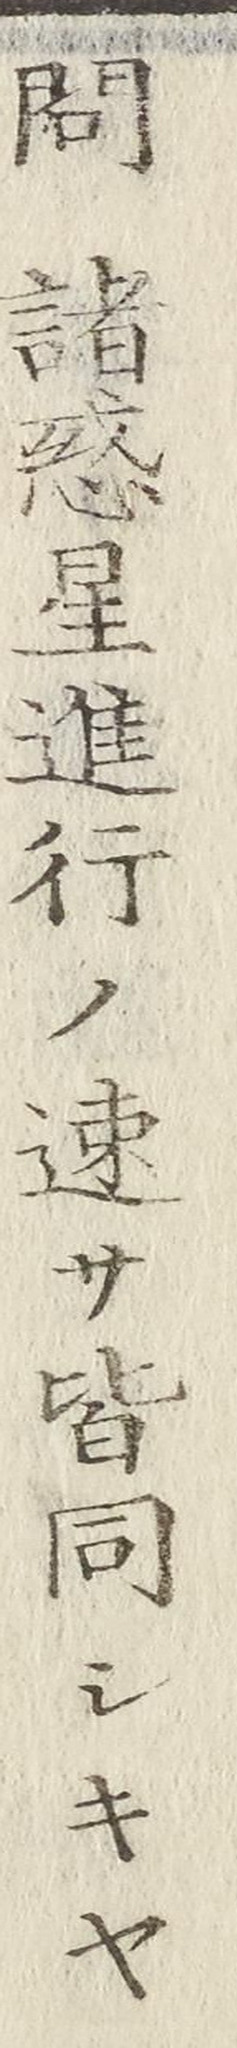問諸惑星進行ノ速サ皆同シキヤ
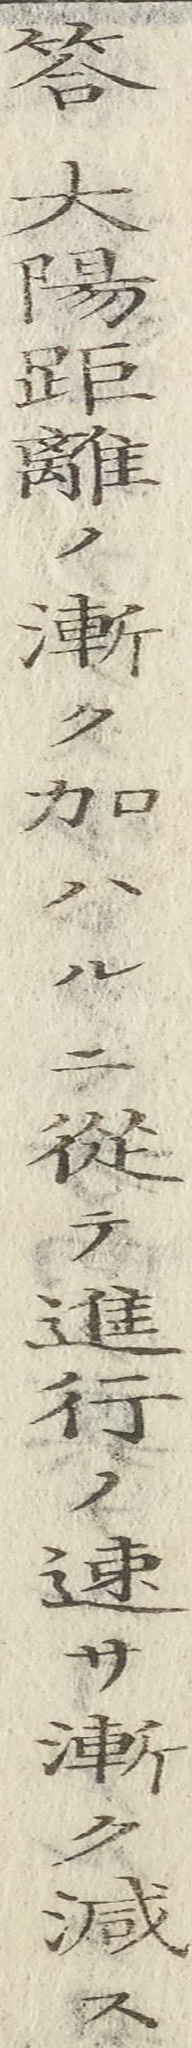答大陽距離ノ漸ク加ハルニ従テ進行ノ速サ漸ク減ス
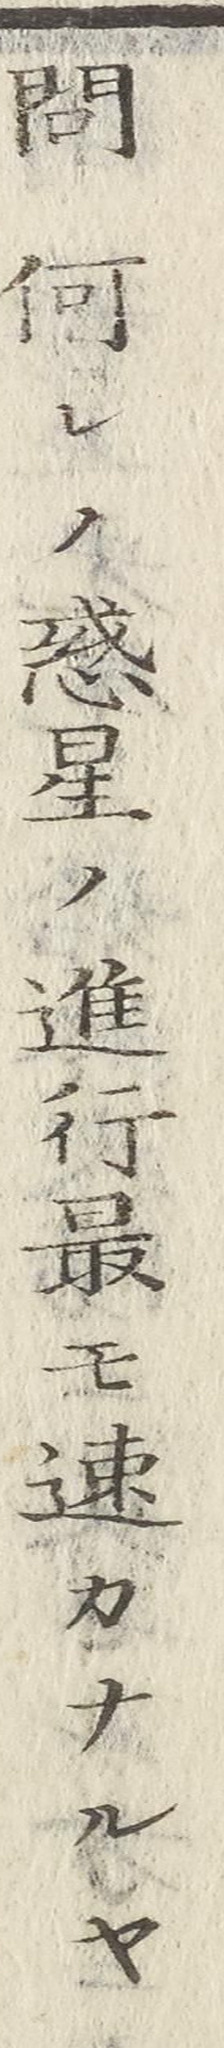問何レノ惑星ノ進行最モ速カナルヤ
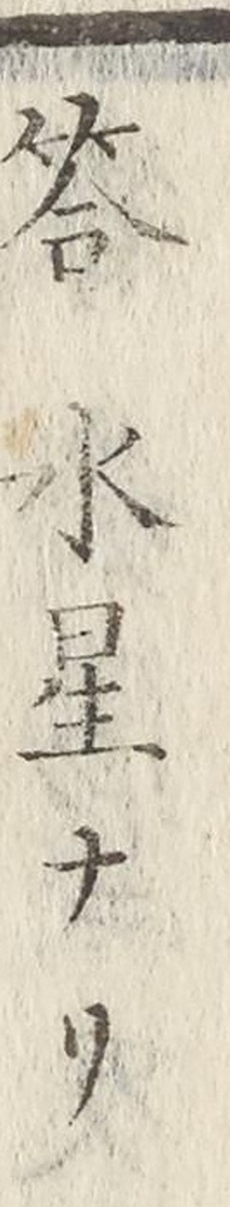答水星ナリ
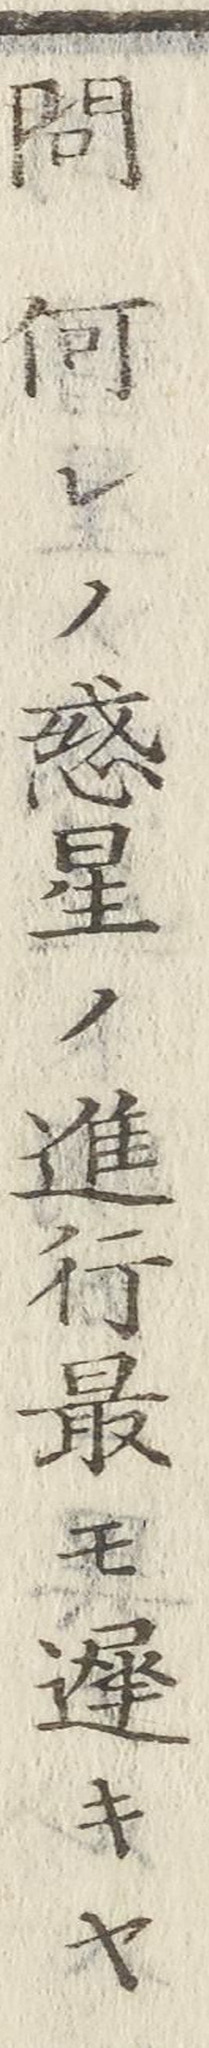問何レノ惑星ノ進行最モ遅キヤ
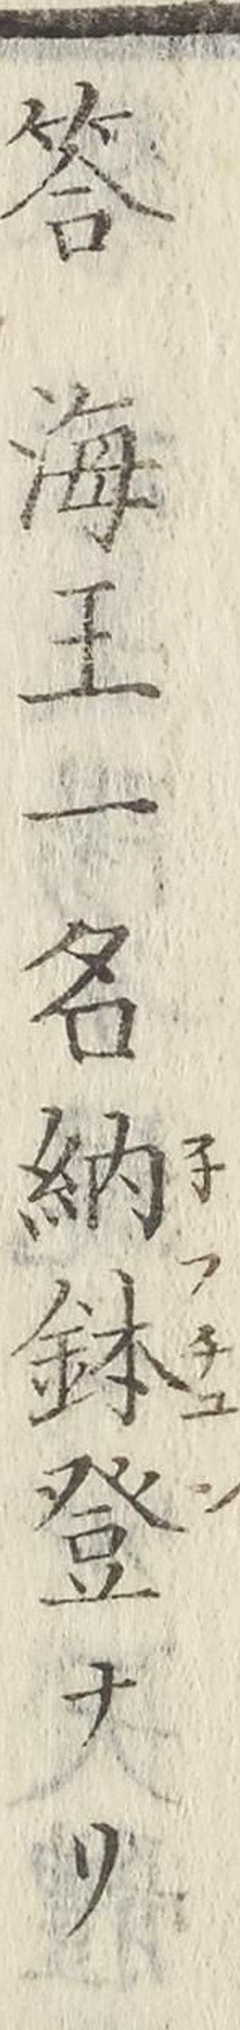答海王一名納鉢登ナリ
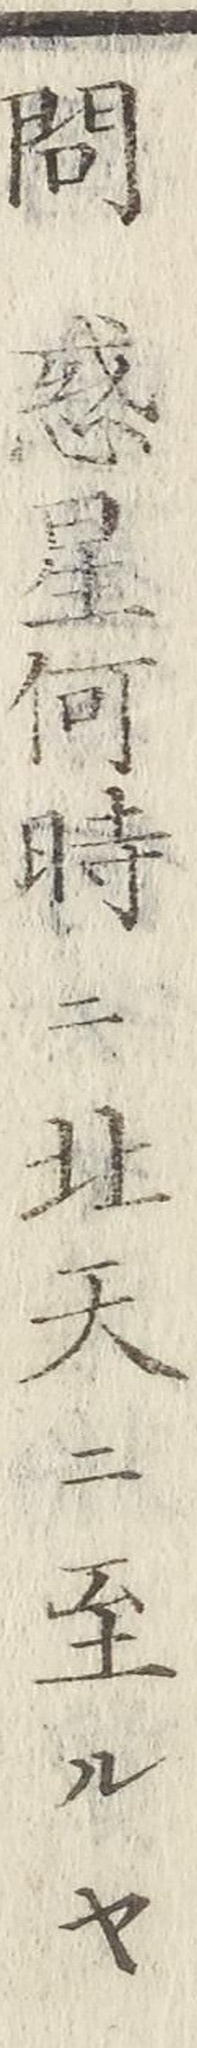問惑星何時ニ北天ニ至ルヤ
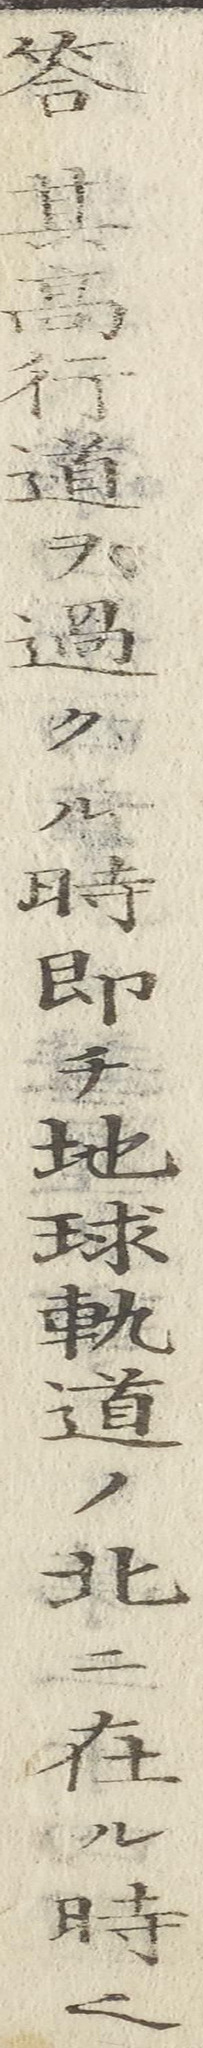答其高行道ヲ過クル時即チ地球軌道ノ北ニ在ル時也
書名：星学圖説　下
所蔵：東京大学地震研究所図書室 Earthquake Research Institute Library, The University of Tokyo, JAPAN
